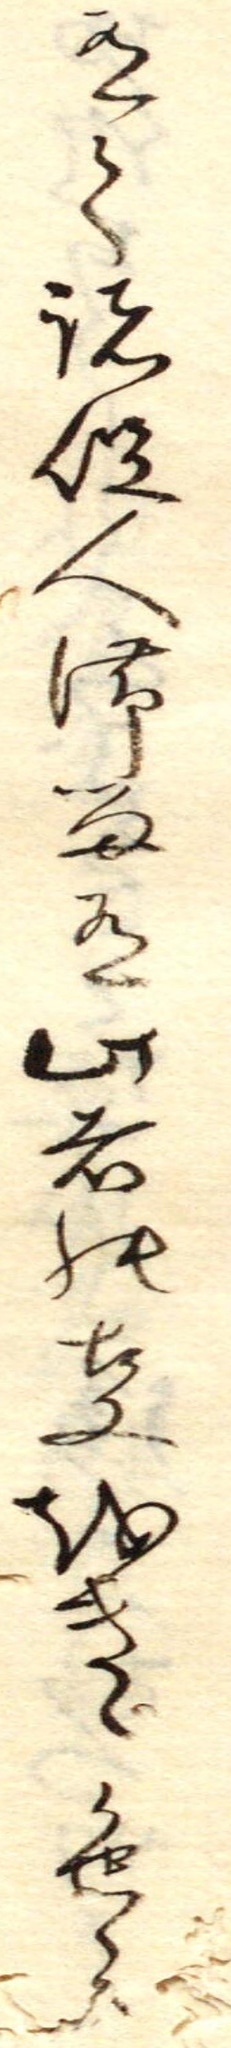有て諸役人滞留有此者の事をきゝ色々
